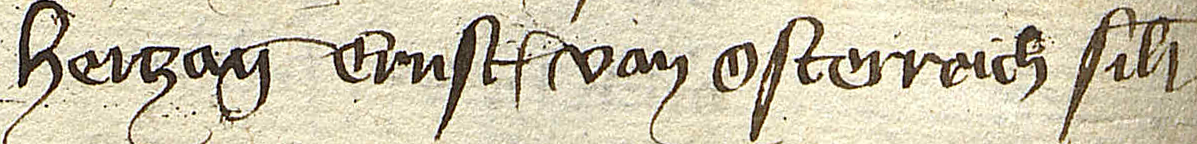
hercʒog Ernſt* von Oſterreich ſilr*
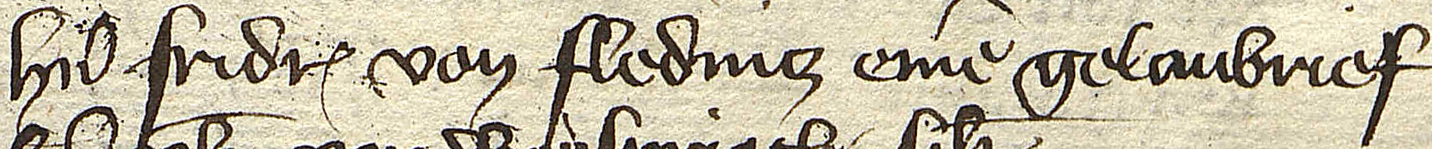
hn* fridr* von flednicʒ eine* gelaubrief
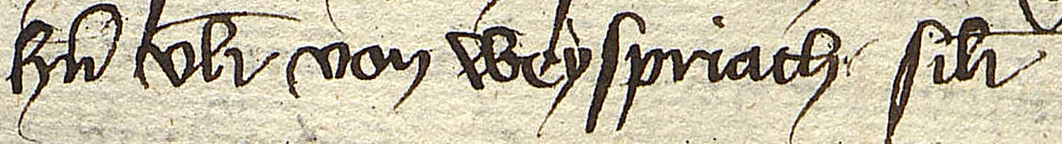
hn* vlr* von weyſpriach / ſilr*
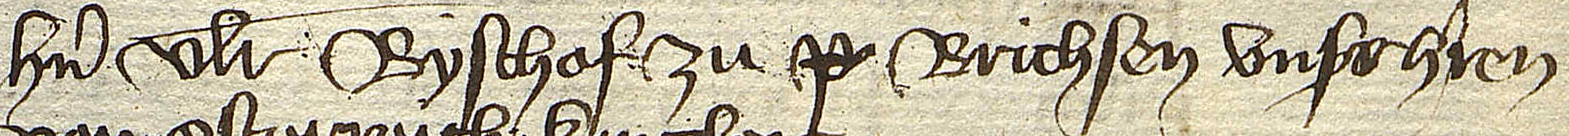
hn* vlr* Byſchof cʒu P Brichſen vnſr* h*ren
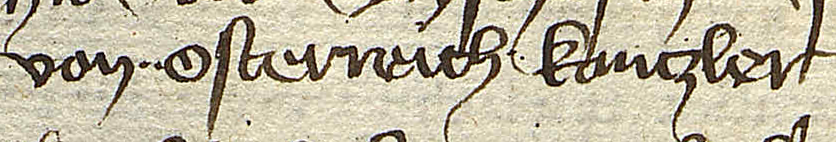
von ~ Oſterreich kancʒler
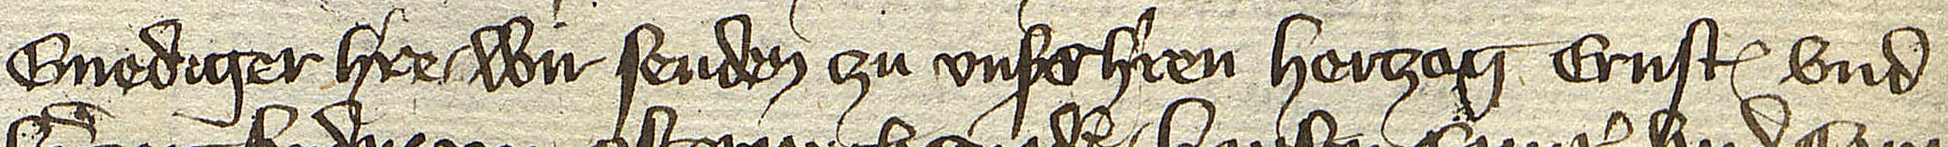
Gnediger h*re / wir ſenden cʒu vnſ*r h*ren hercʒog Ernst* vnd
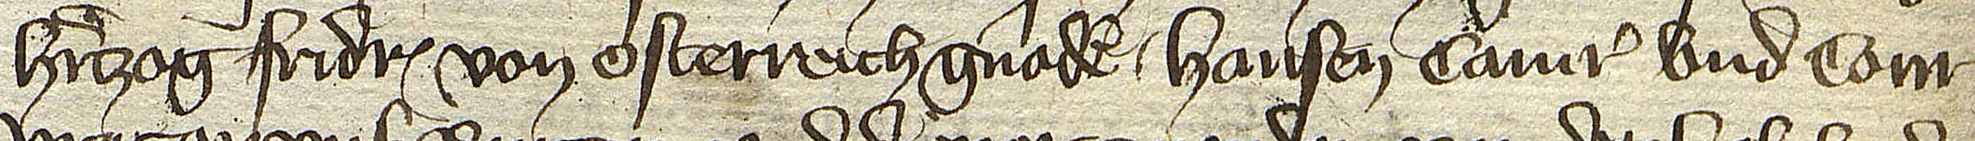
h*rcʒog fridr* von Oſterreich gnad* / hanſen Camr* vnd Conr*
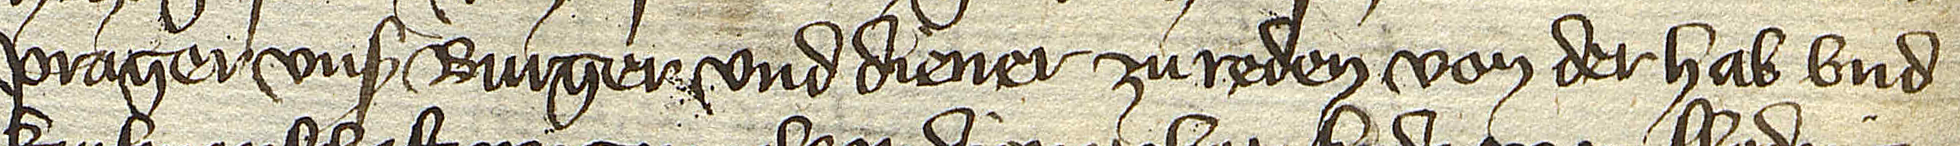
Prager vnſ* Burger vnd diener cʒu reden vond er hab vnd
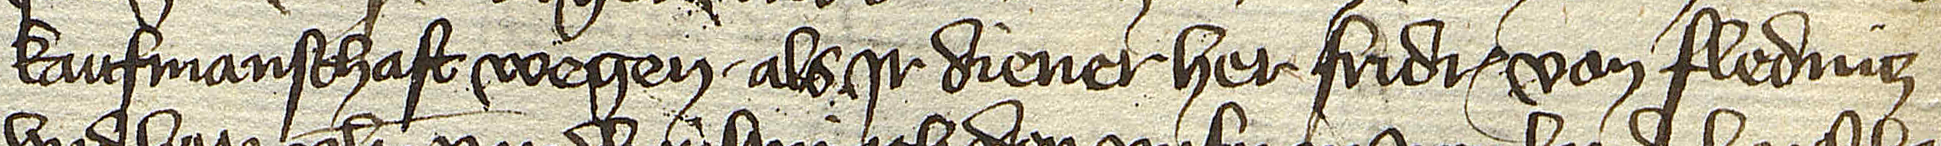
kaufmanſchaft wegen / als Ir diener her fridr* von flednicʒ
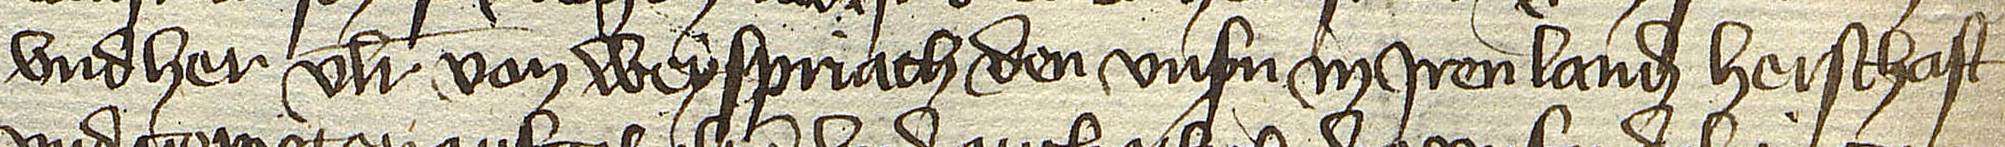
vnd her vlr* von weyſpriach / den vnſ*n in Iren land* herſchaft
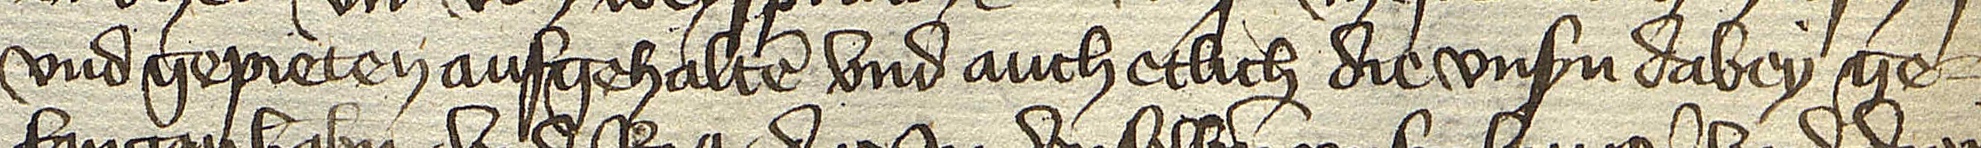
vnd gepieten aufgehalte* vnd auch etlich die vnſ*n dabey ge =
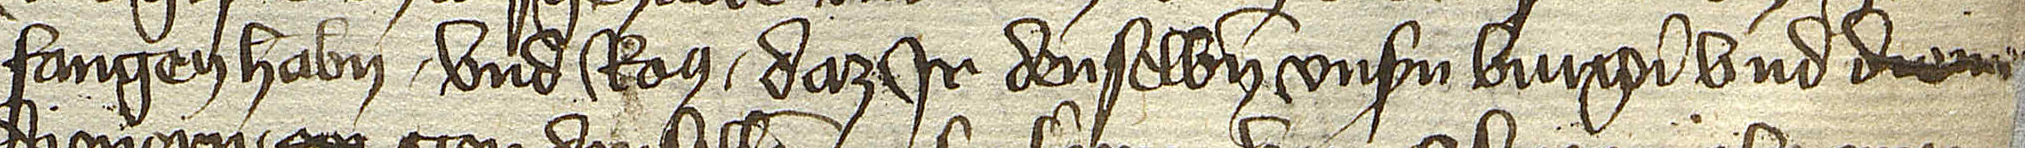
fangen habn* / vnd Ro* / daʒ Ir denſelbn* vnſ*n burgn* vnd diener
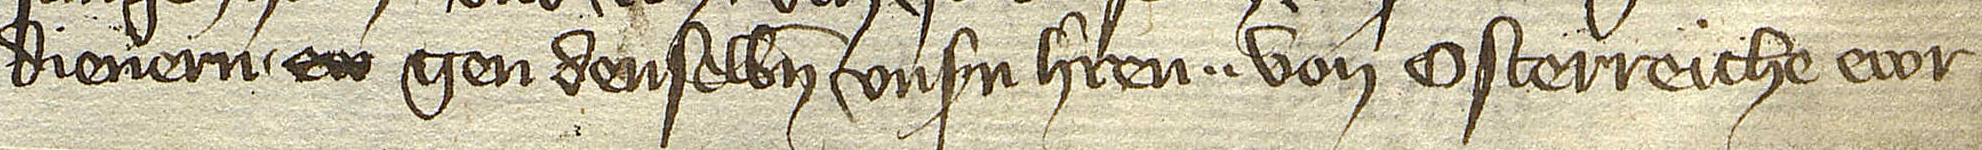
dienern / ew gen denſelbn* vnſ*n h*ren ~ von Oſterreiche ewr
